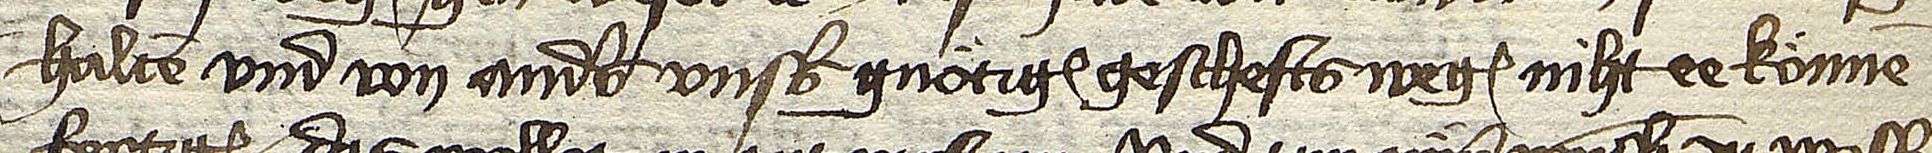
halte* vnd von and*s vnſ*s gnötig* geſchefts weg* niht ee könne*
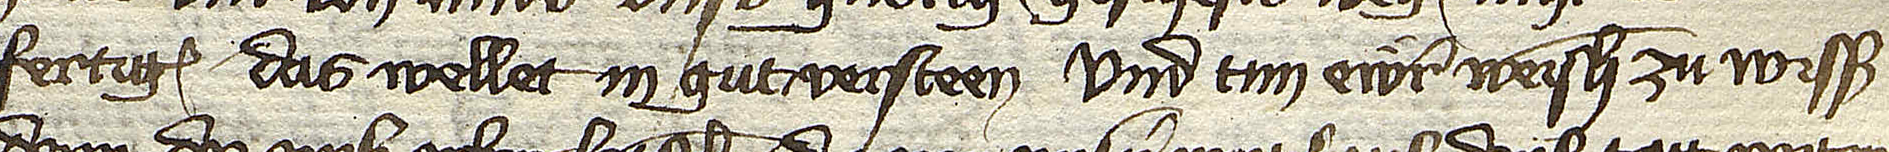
fertig* / das wellet in gut verſteen Vnd tun eẅ*r weiſh* ʒu wiſſ*
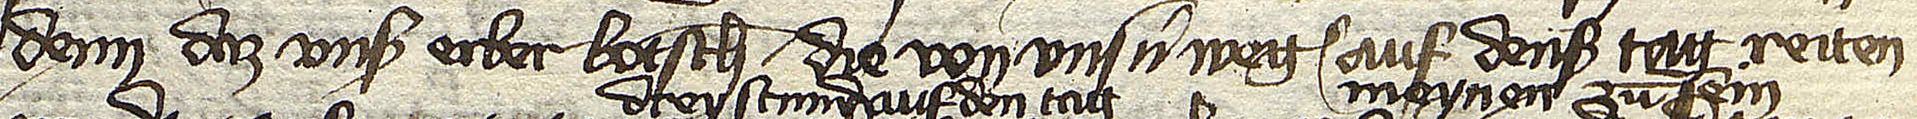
denn daʒ vnſ* erber botſch* / die von vnſ*n weg* auf denſ* tag reiten
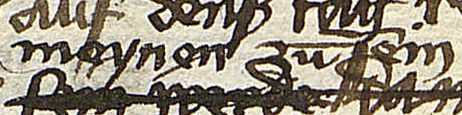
meynen ʒu ſein
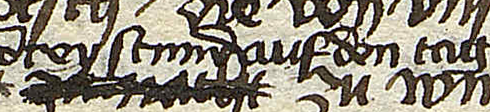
drey ſtund auf den tag
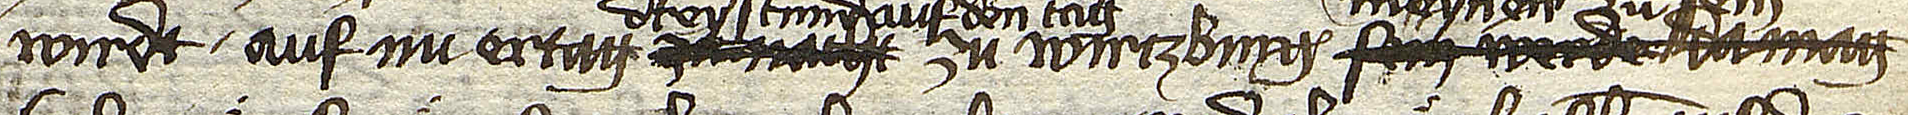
wirdt / auf nu ertag ʒu nacht ʒu wircʒburg ſein werde da mag
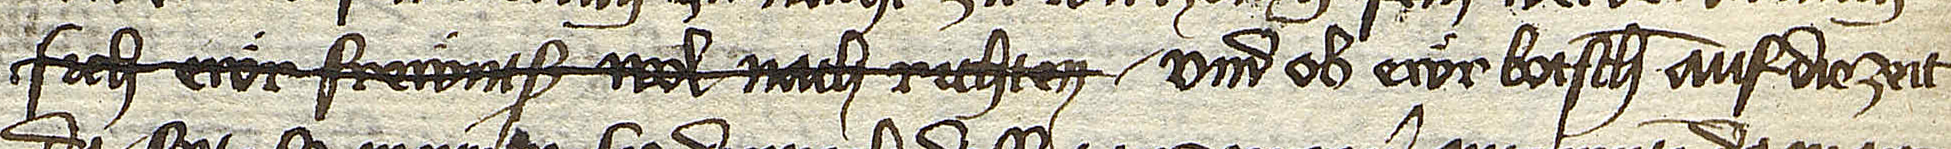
ſich eẅr freẅntſ* wol nach richten / vnd ob eẅr botſch* auf die ʒeit
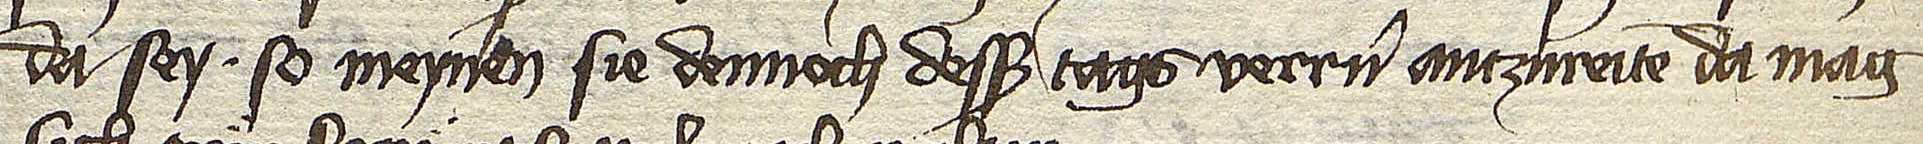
da ſey . ſo meynen ſie dennoch deſſ* tags verrn* ancʒureite* da mag
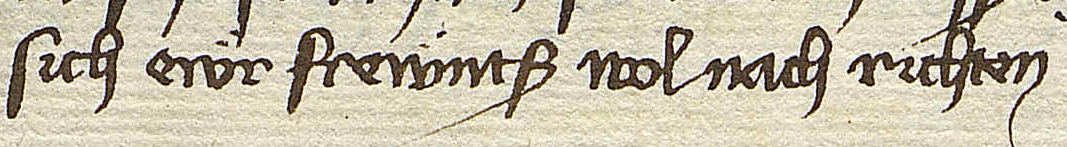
ſich eẅr freẅntſ* wol nach richten
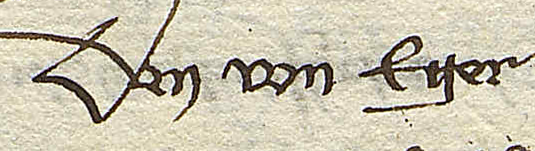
Den von Eger
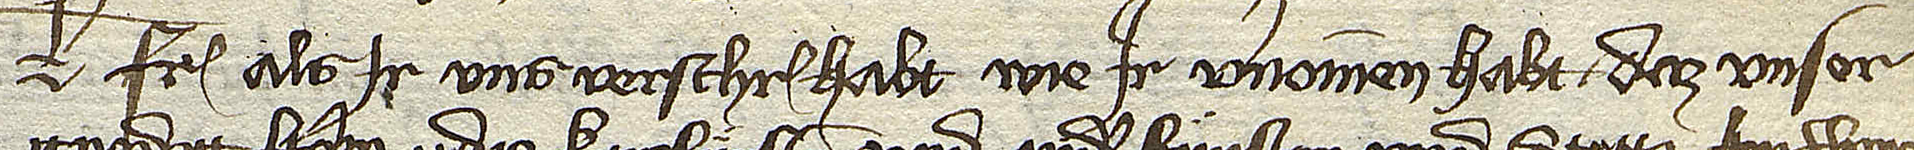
L* fr* als Ir vns verſchr* habt wie Ir v*nomen* habt / daʒ vnſer
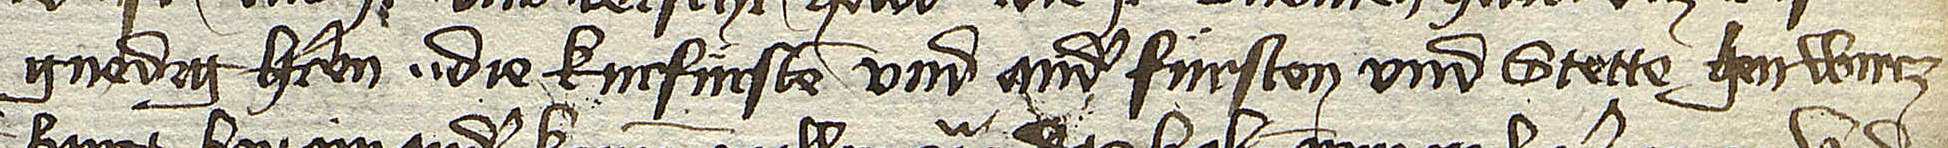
gnedig h*ren ~ die kurfürſte* vnd and* fürſten vnd Stette gen wircʒ
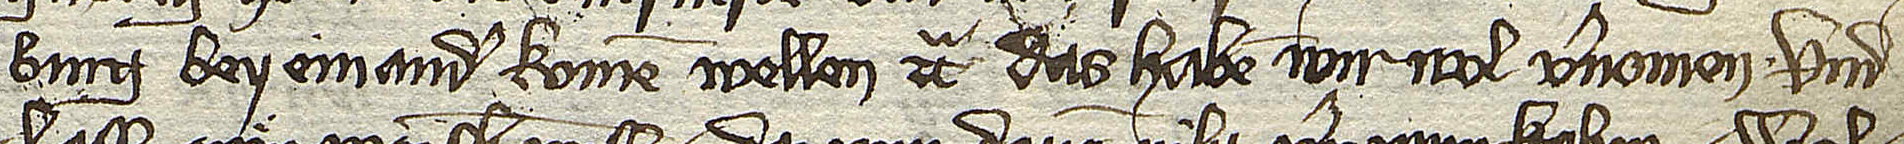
- burg bey einand* kome* wellen ec* das habe* wir wol v*nomen . Vnd
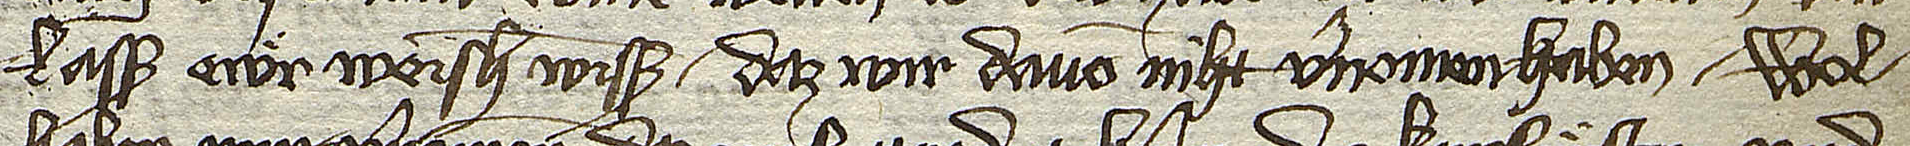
laſſ* eẅr weiſh* wiſſ* / daʒ wir dauo* niht v*nomen haben / Wol
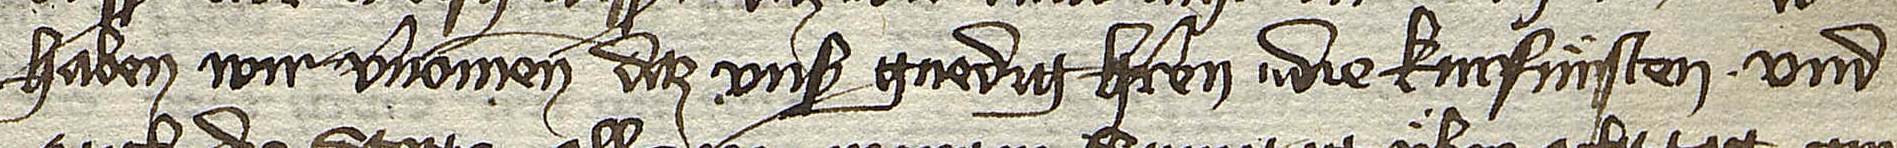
haben wir v*nomen* daʒ vnſ* gnedig h*ren ~ die kurfürſten . vnd
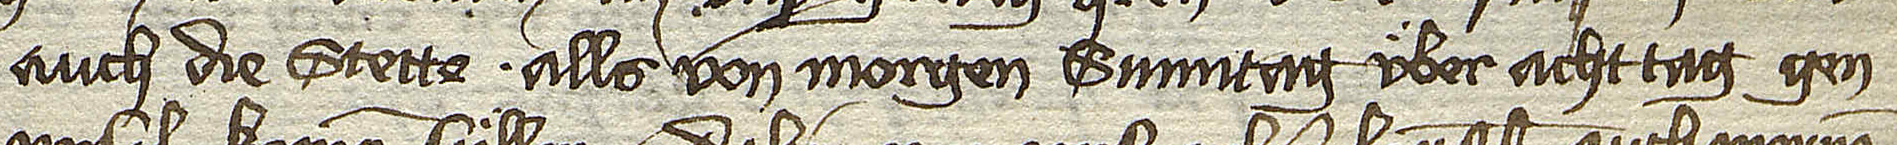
auch die Stette . alls von morgen sunntag v̈ber acht tag gen
